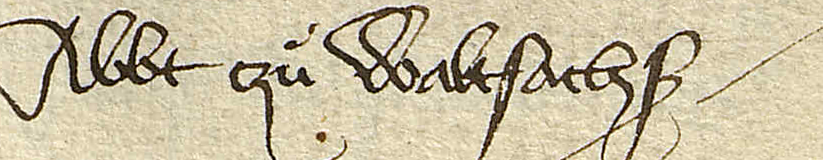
Abbt cʒü Waltſachſ* /
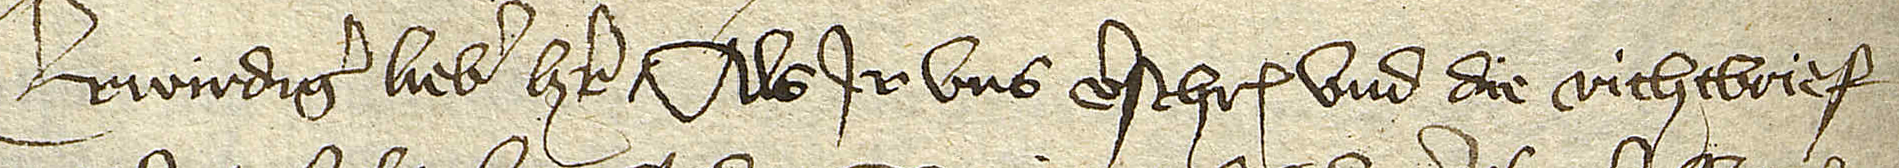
Erwirdig* lieb* hr* / Als Ir vns v*ſchr* vnd die richtbrief
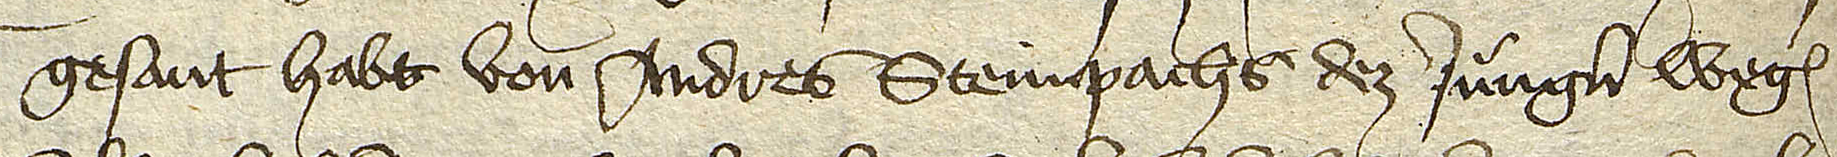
geſant habt von Andres Steimpachs deʒ Iüngn* weg*
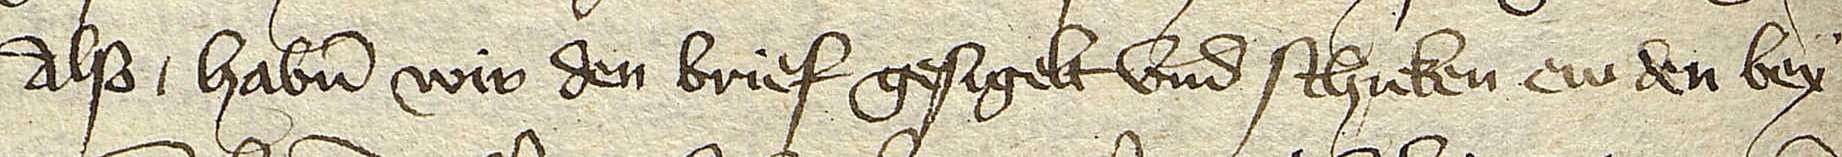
Alſo / habn* wir den brief geſigelt vnd ſchicken ew den bey
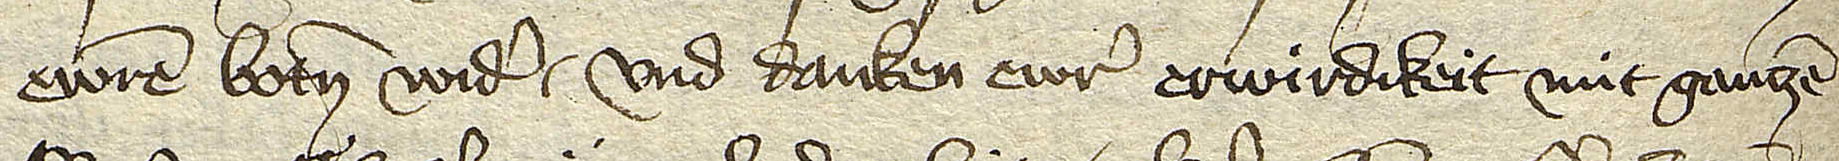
ewre* botn* wid* / vnd danken ewr* erwirdikeit mit gancʒe*
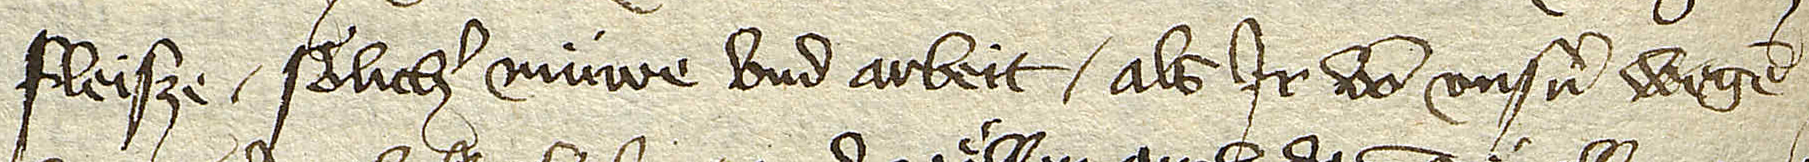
fleiſʒe / ſölich* müwe vnd arbeit / als Ir vo* vnſn* wege*
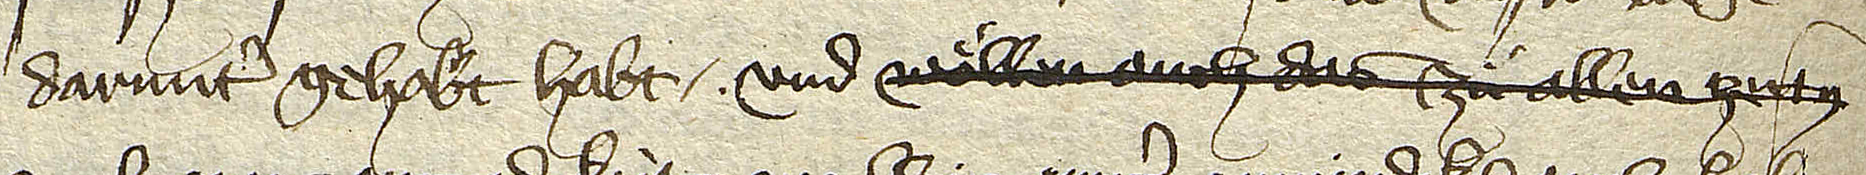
darunt* gehabt habt / . vnd wöllen auch das cʒü allen cʒeitn*
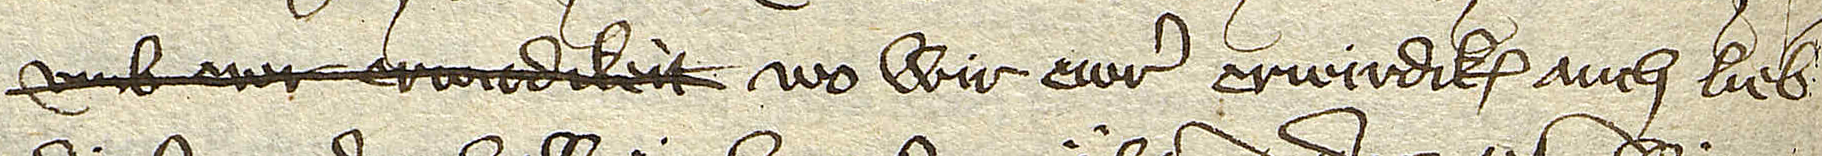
vmb ewr erwirdikeit wo wir ewr* erwirdik* auch lieb
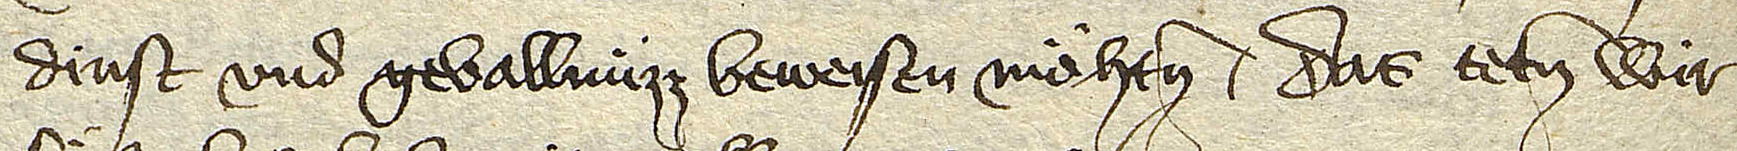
dinſt vnd gevallnüʒʒ beweiſen möhtn* / Das tetn* wir
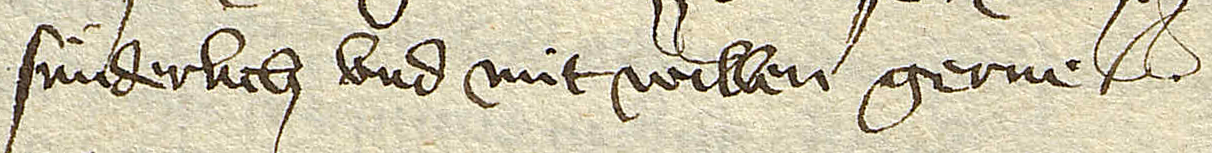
ſünderlich vnd mit willen gerne / .
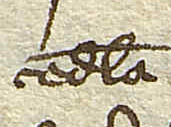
cedla*
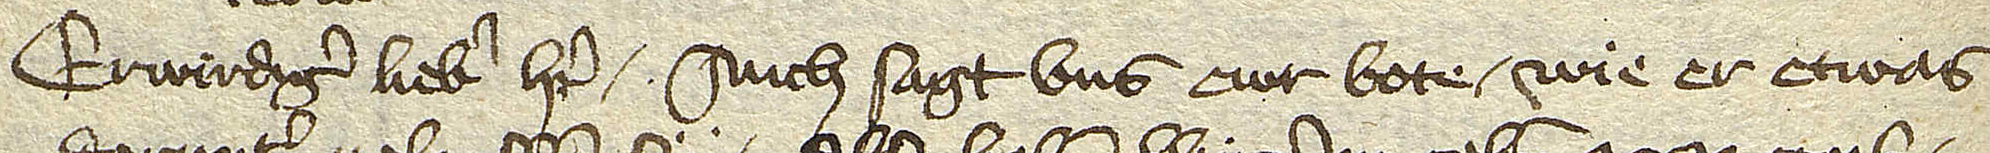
Erwirdig* lieb* hr* / . Auch ſagt vns ewr bote / wie er etwas
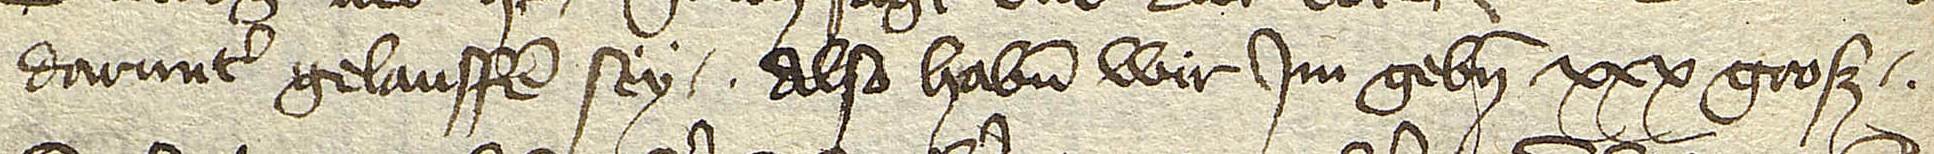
darunt* gelauffe* ſey / . Alſo habn* wir Im gebn* xxx groſʒ / .
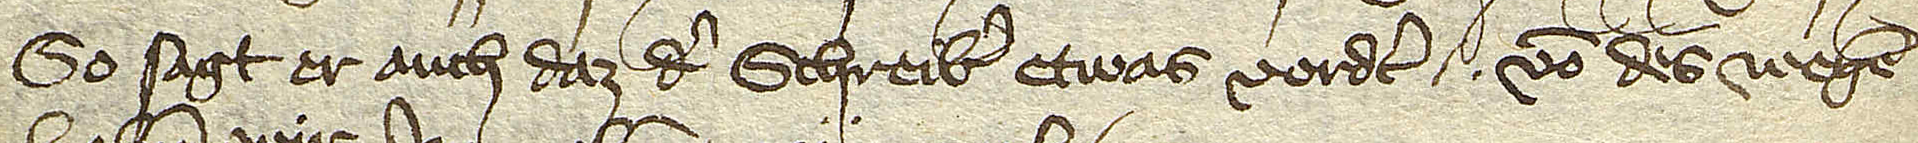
So ſagt er auch daʒ d* Schreib* etwas vordt* / . vo* des wege*
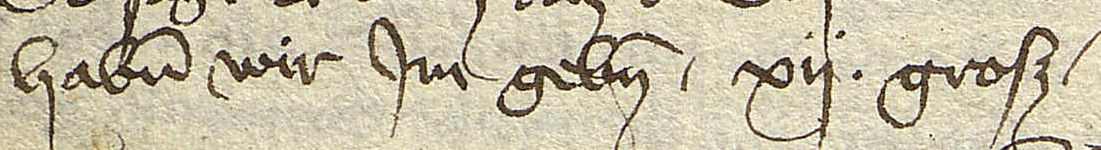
habn* wir Im gebn* / xii . groſʒ /
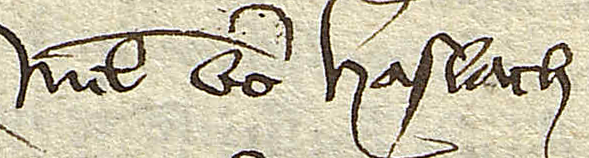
Nicl* vo* Haſlach
